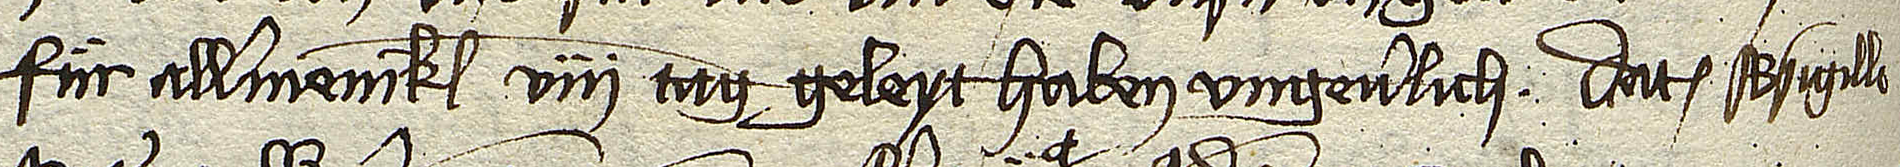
für allmenikl* viii tag geleyt haben vngeu*lich . Dat* ſ*b ſigillo
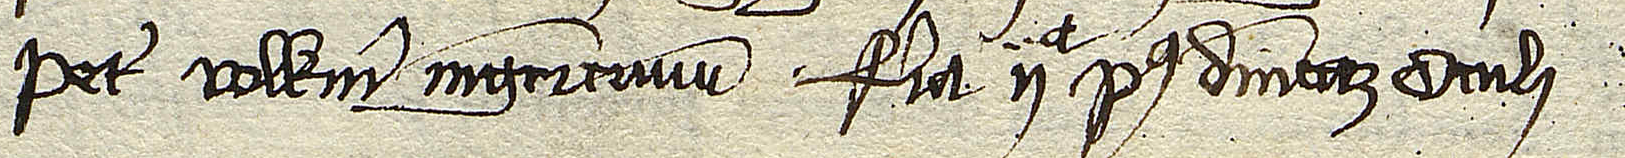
pet* volkm* mgri* ciuiu* . f*ia ii* p* dnica* Oculi
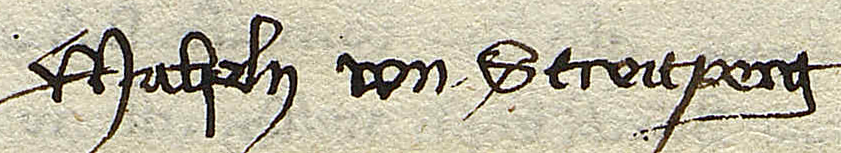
Micheln von Streitperg
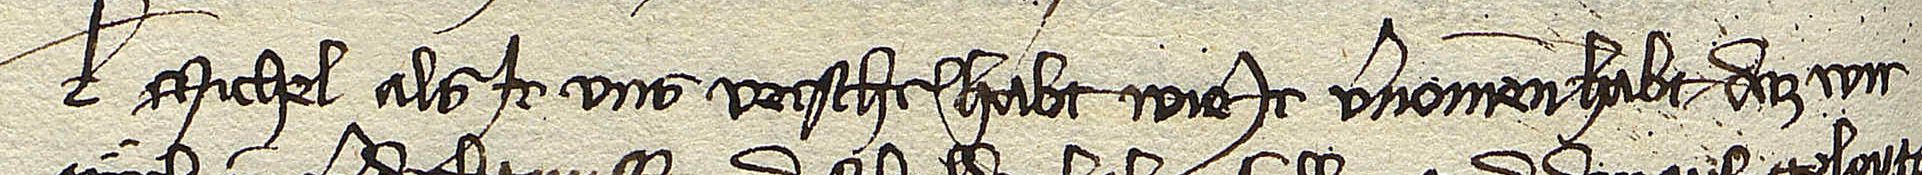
L* Michel als Ir vns verſchr* habt wie Ir v*nomen habt / daʒ wir
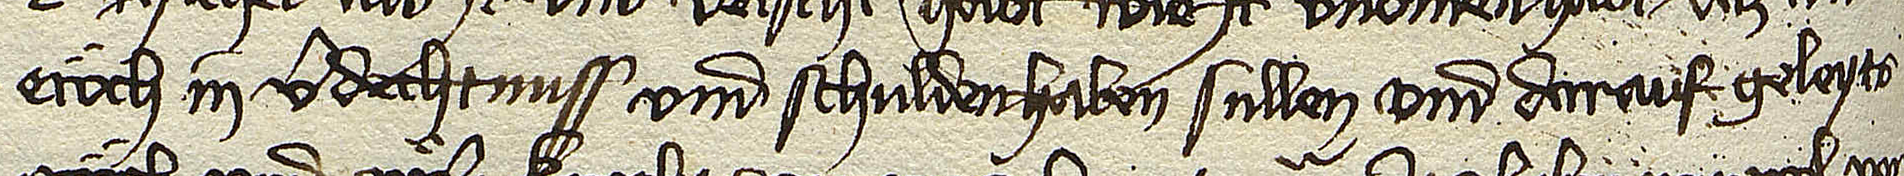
eẅch in v*dechtnuſſ vnd ſchulden haben ſullen vnd darauf geleyts
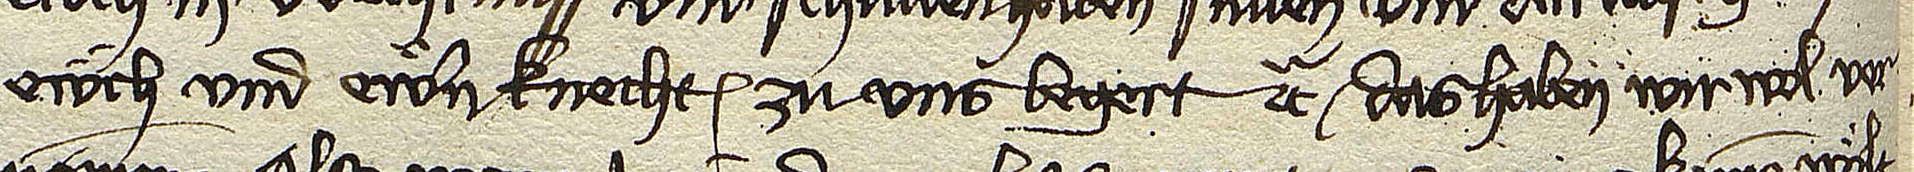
eẅch vnd eẅ*n knecht* ʒu vns begert ec* / das haben wir wol ver
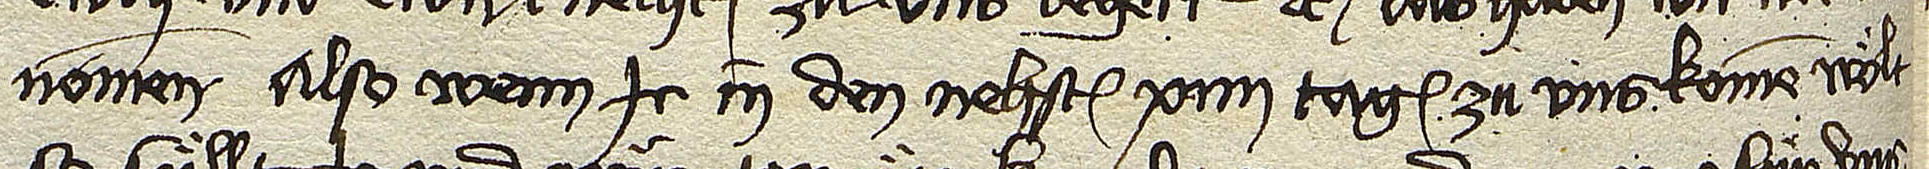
nomen Alſo wenn Ir in den nehſt* xiiii tag* ʒu vns kome* wölt
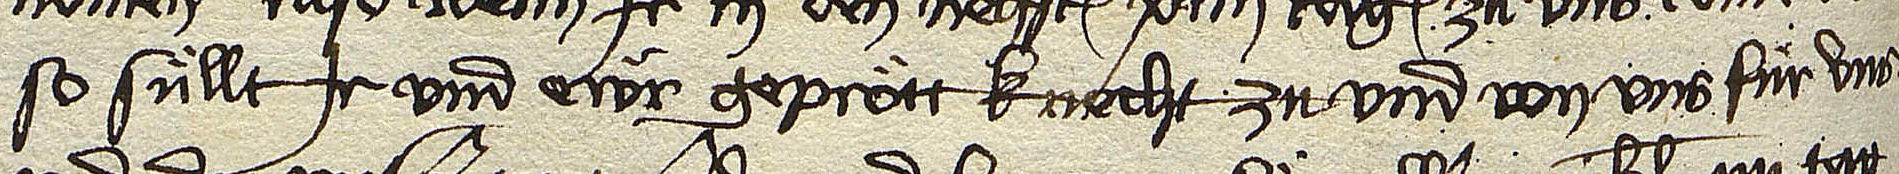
ſo ſüllt Ir vnd eẅr geprött knecht ʒu vnd von vns für vns
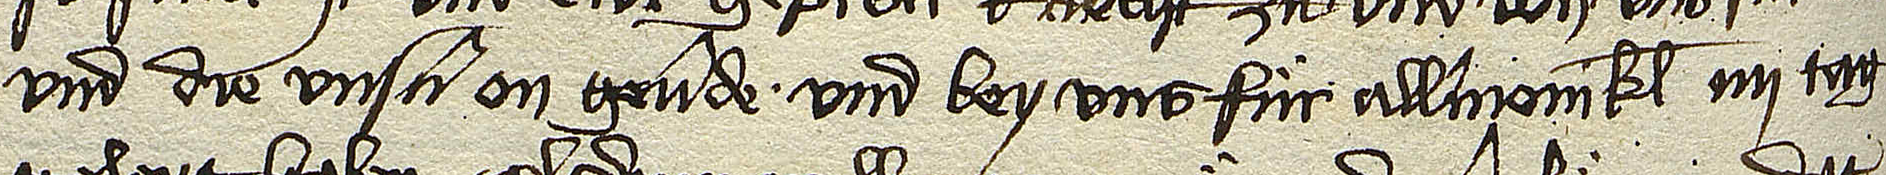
vnd die vnſ*n on geu*de . vnd bey vns für allmenikl* iiii tag
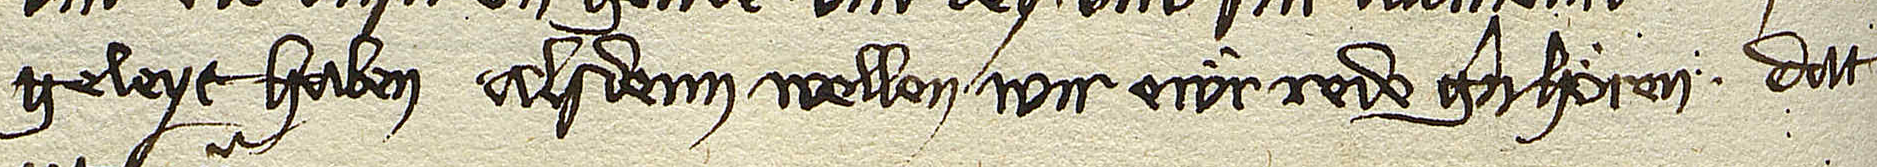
geleyt haben . Alſdenn wellen wir eẅr rede g*n hören . Dat*
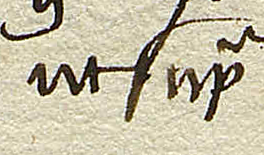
ut* ſup*
